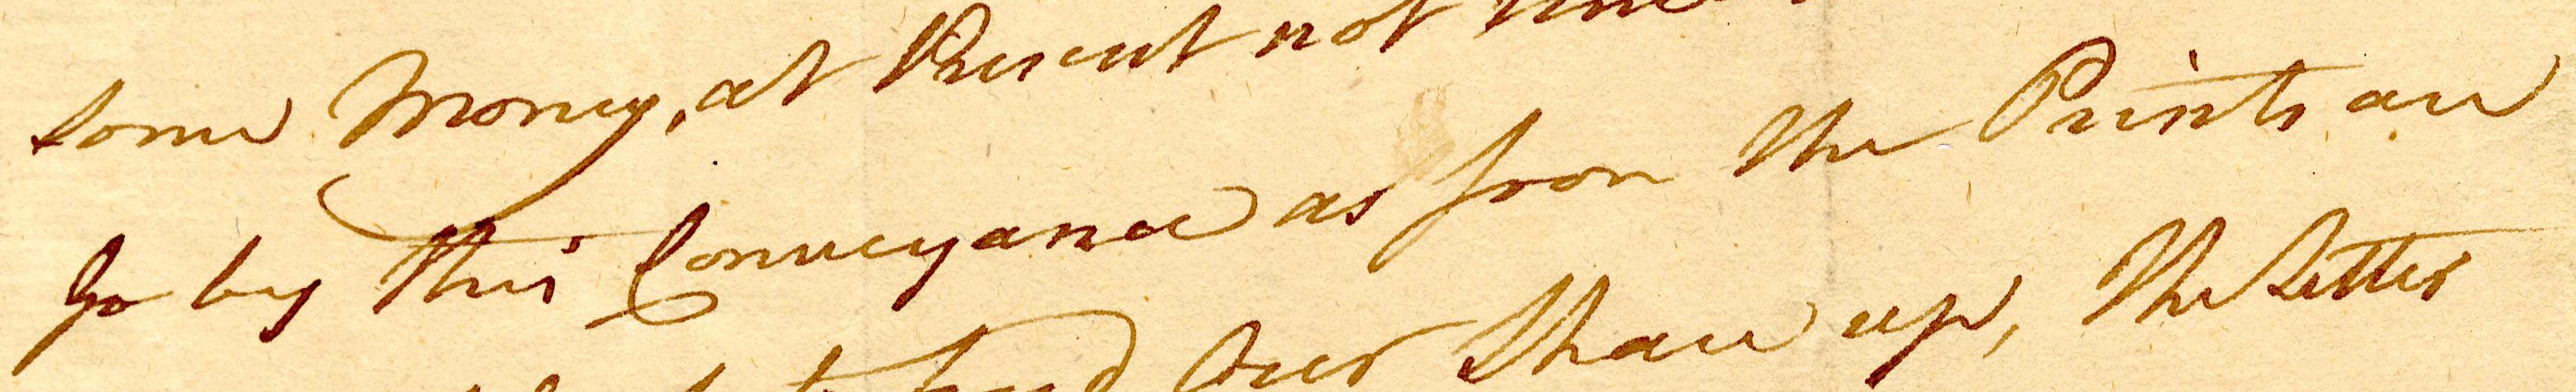go by this Conveyance as soon the Prints are
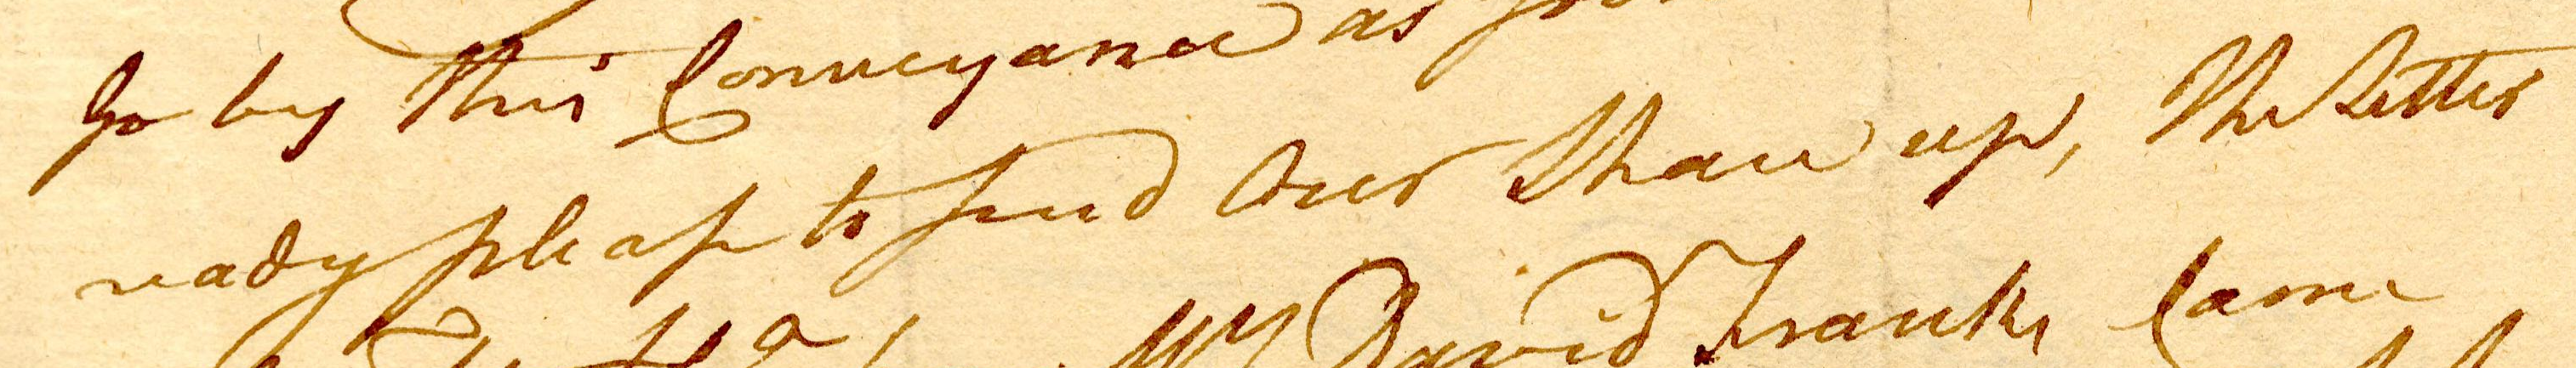ready please to send our Share up, the letter
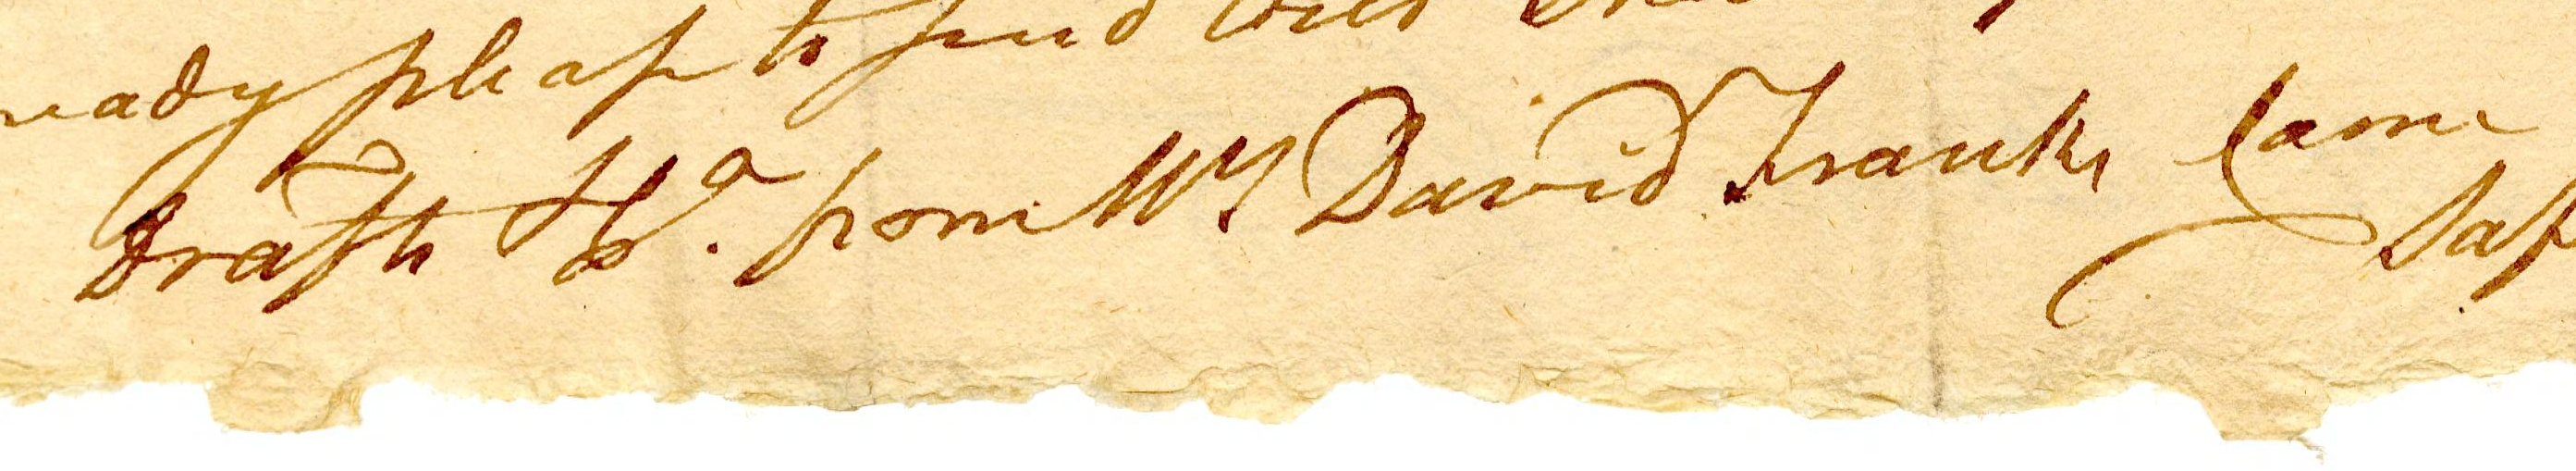Draft &C^a. from M^r Davis Frank Came
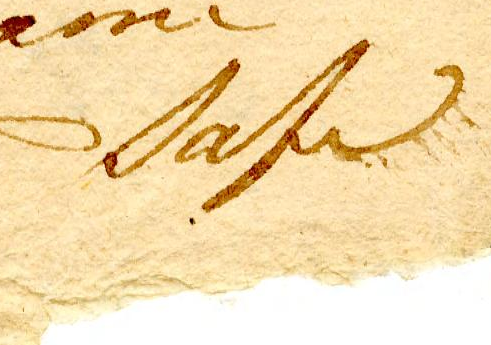safe
